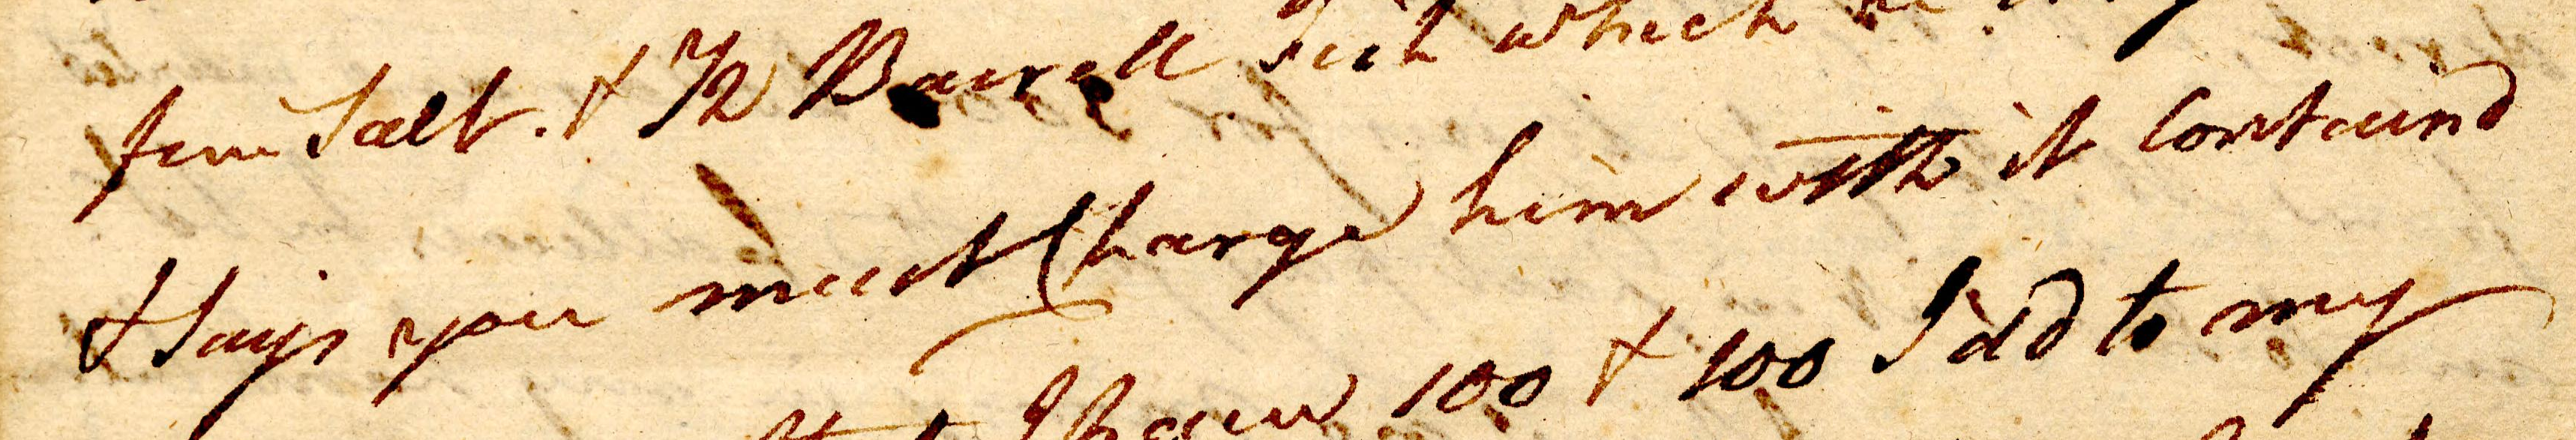& says you must Charge him with it contain'd
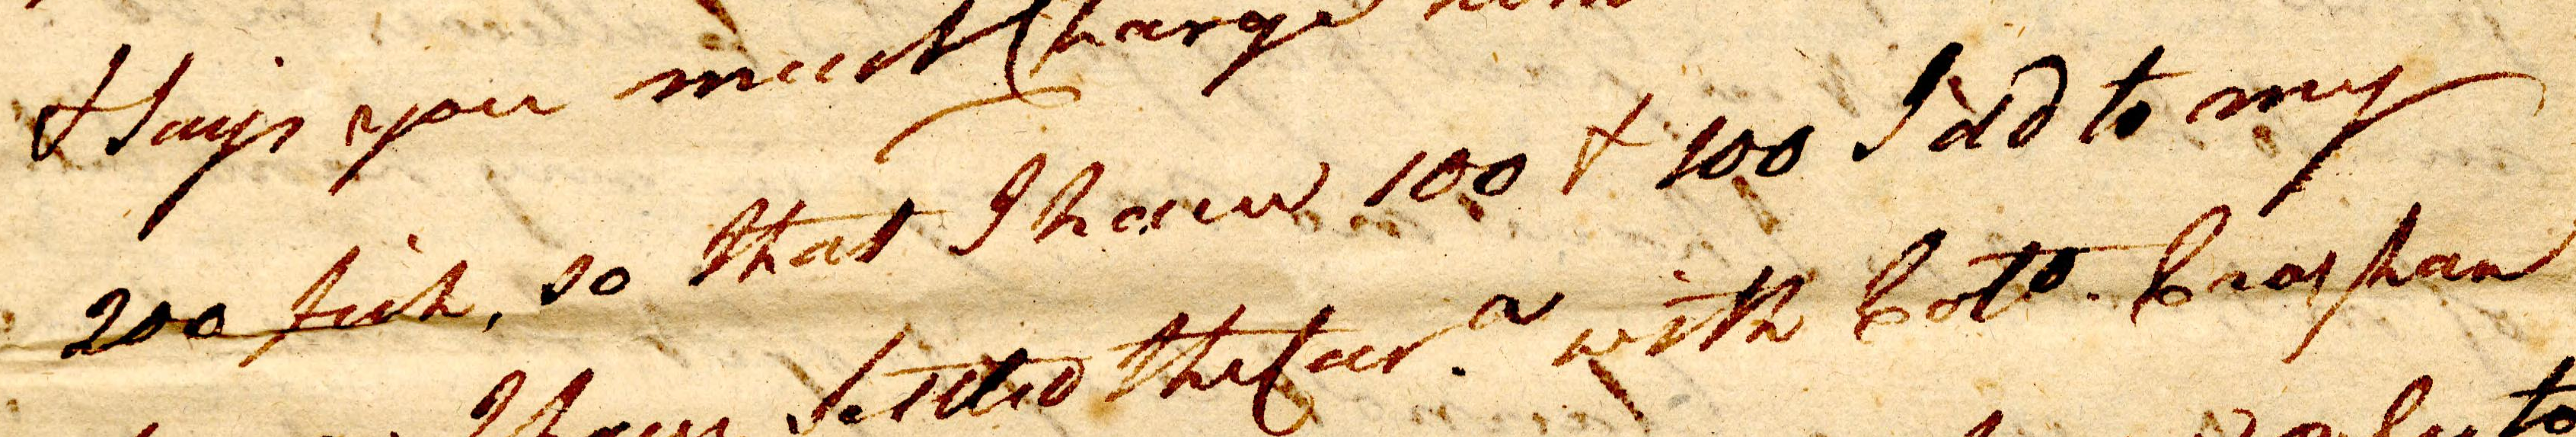20o fish, so that I have 100 & 100 I ad to my
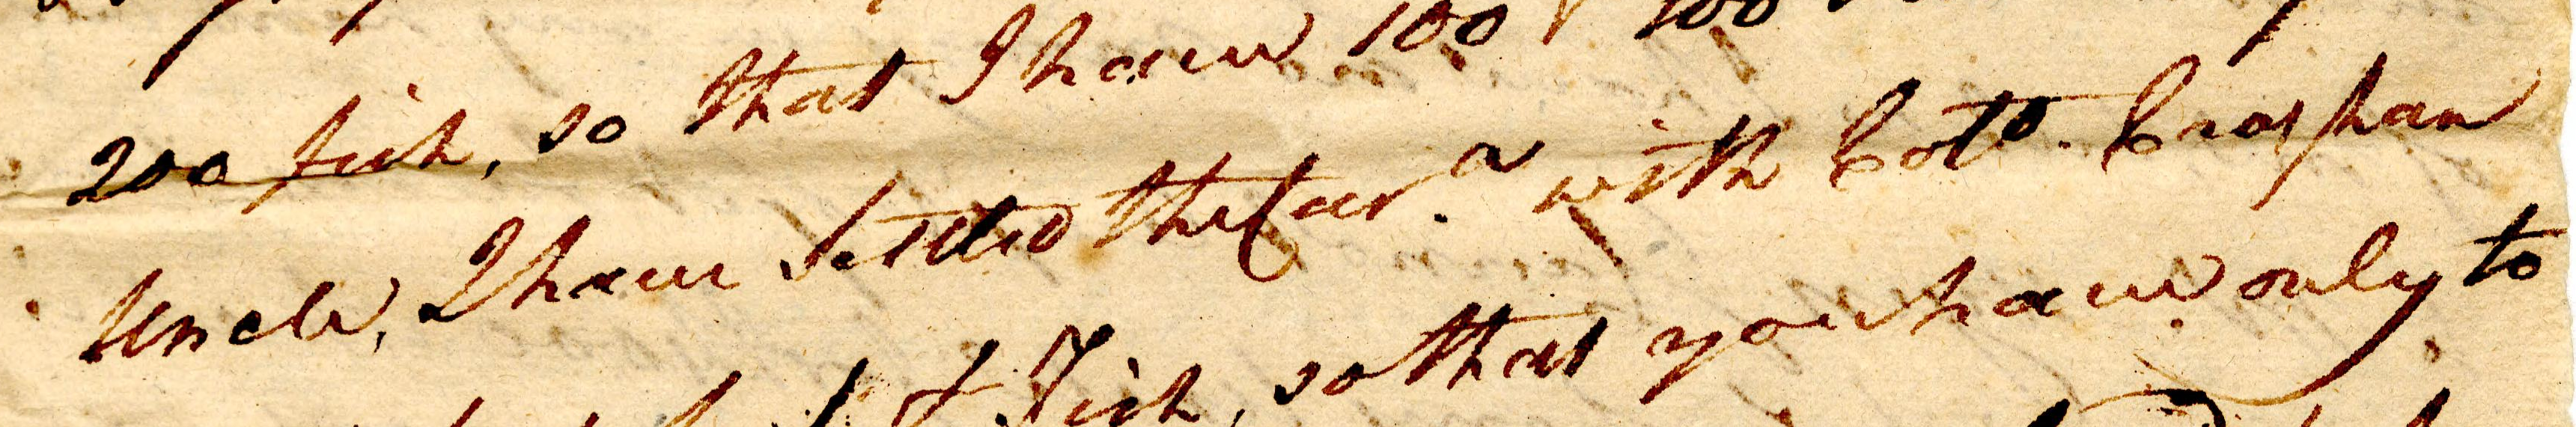senew, I have settled the Car^a. with Col^o Croghan
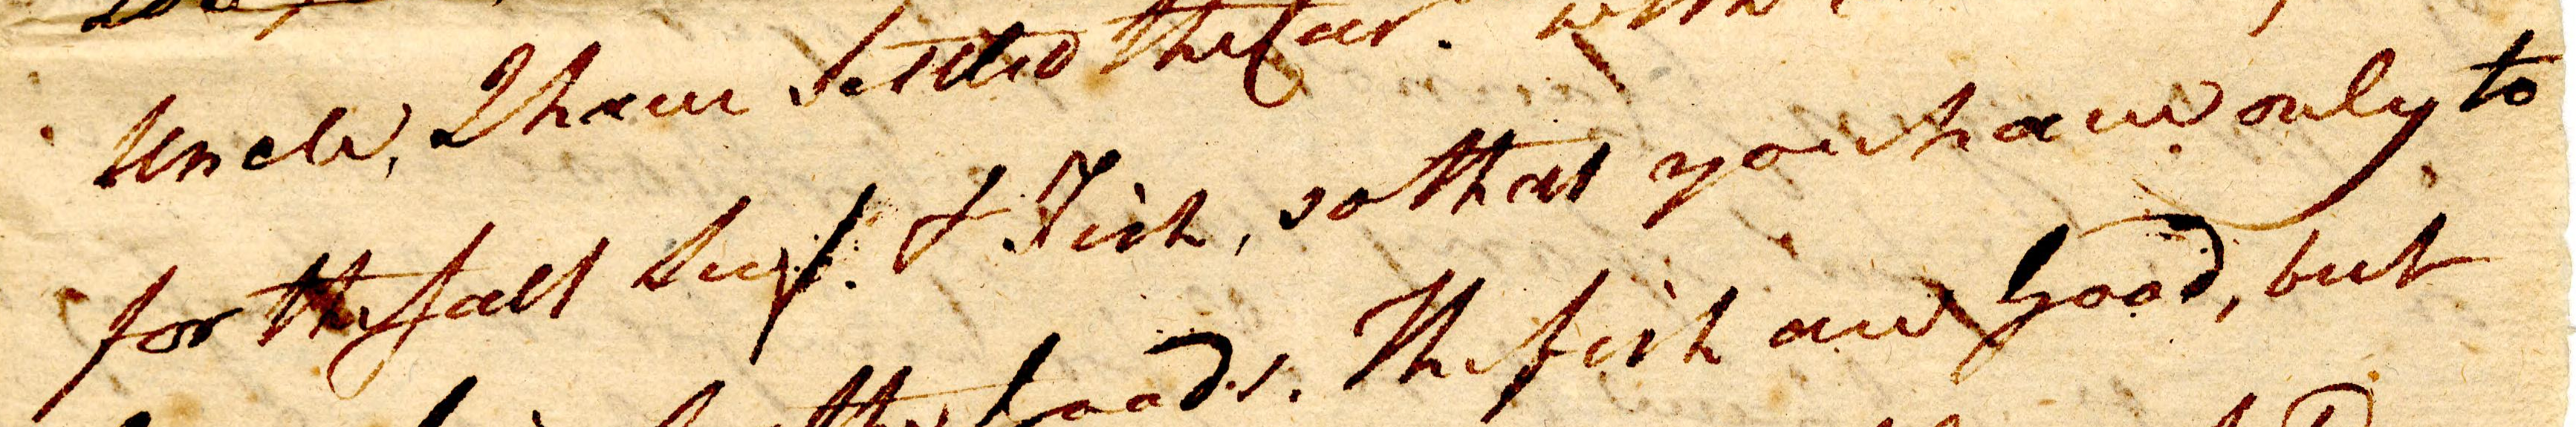for the salt Sug^r. & fish, so that you have only to
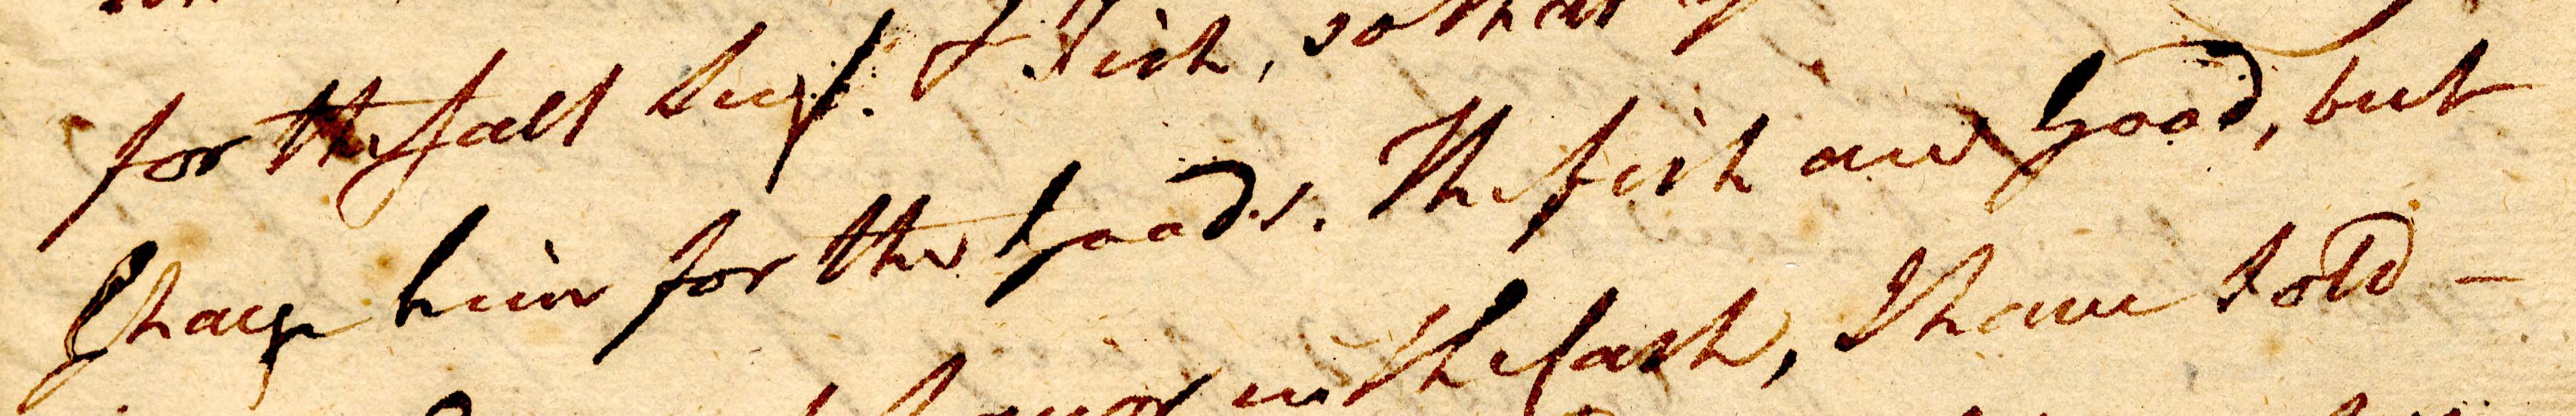Charge him for the Goods. The fish are Good, but
